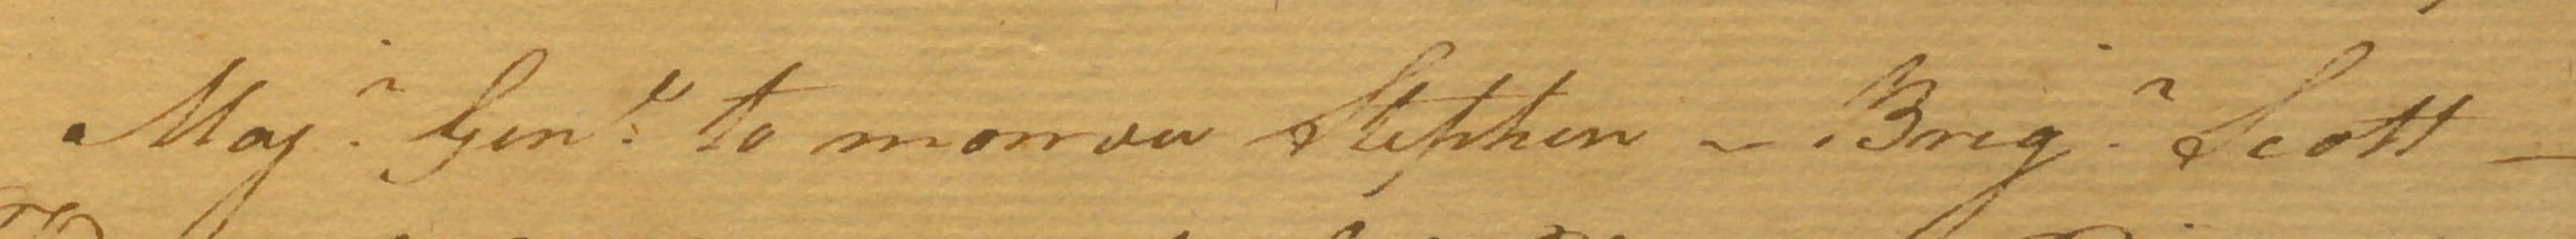Maj^r. Gen^l. to morrow Stephen .. Brig^r. Scott-
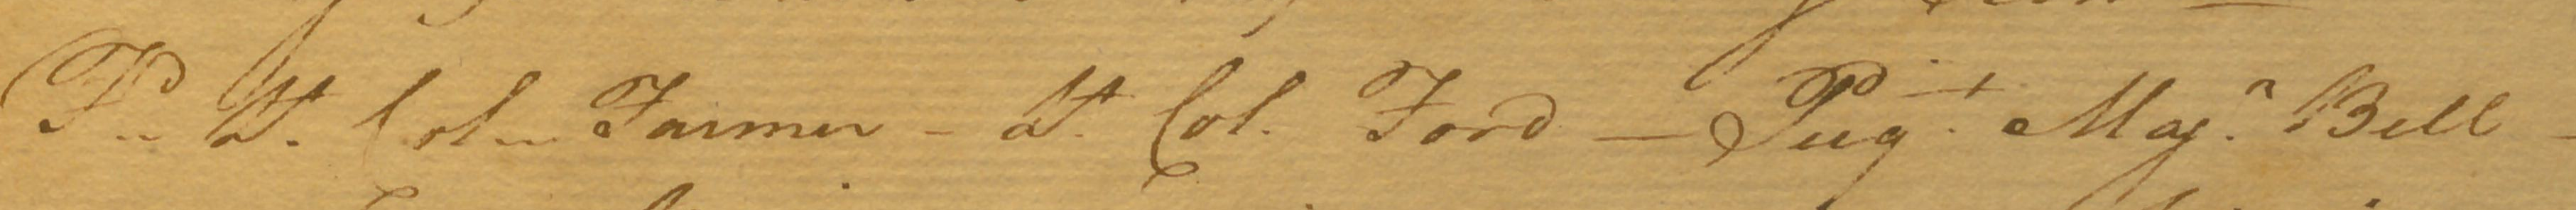F^d. L^t. Col. Farmer- L^t. Col. Ford- Picq^t. Maj^r. Bell
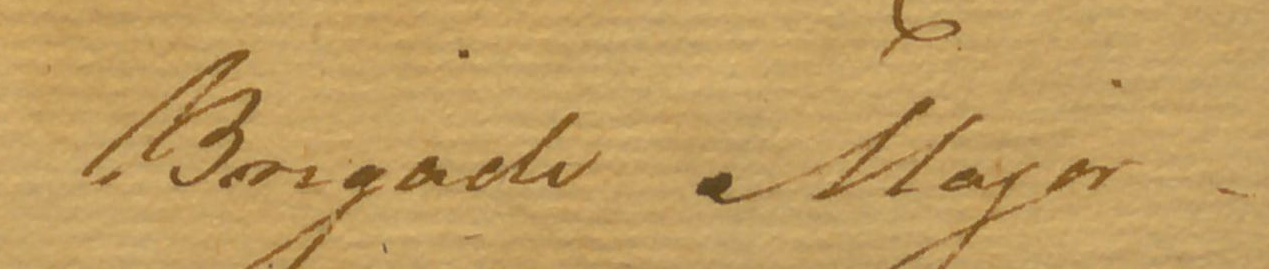Brigade Major
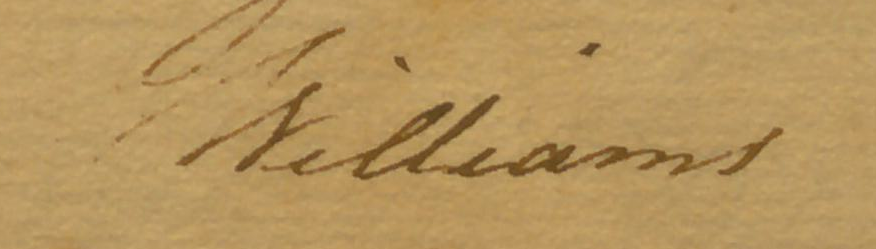Williams
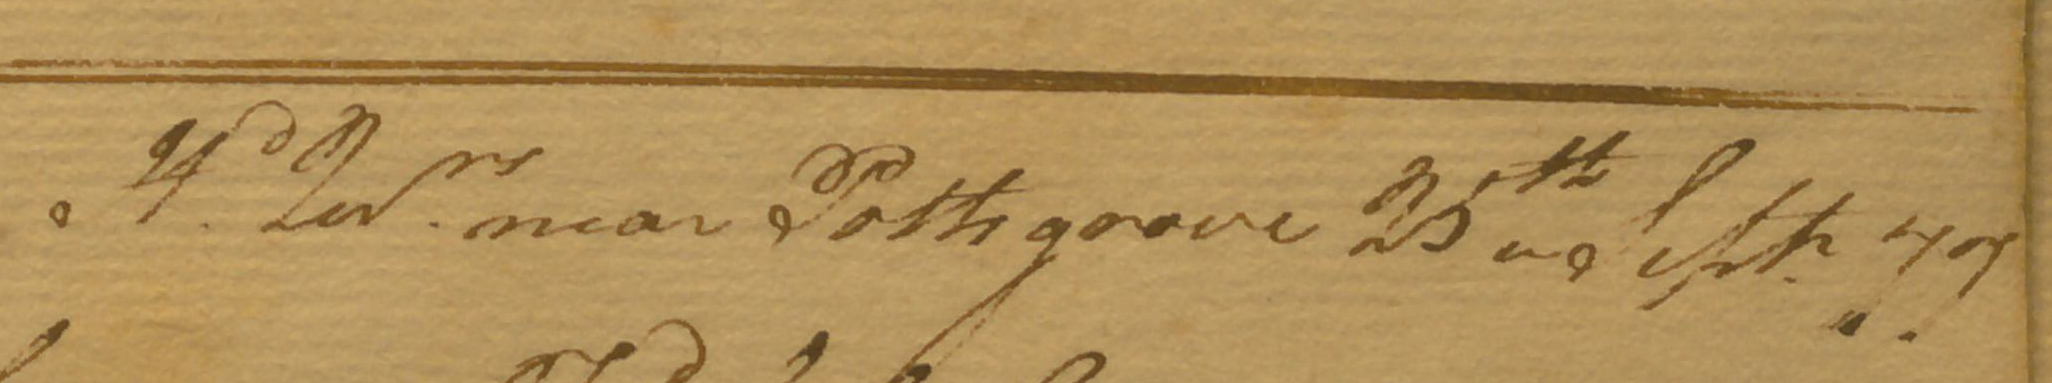H^d. Qu^rs. near Pathgrove 25^th Sept^r. 77
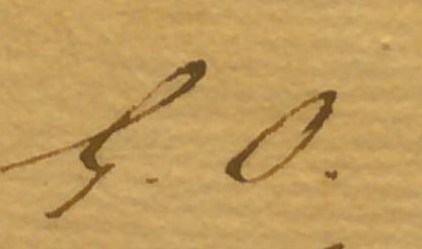G.O.
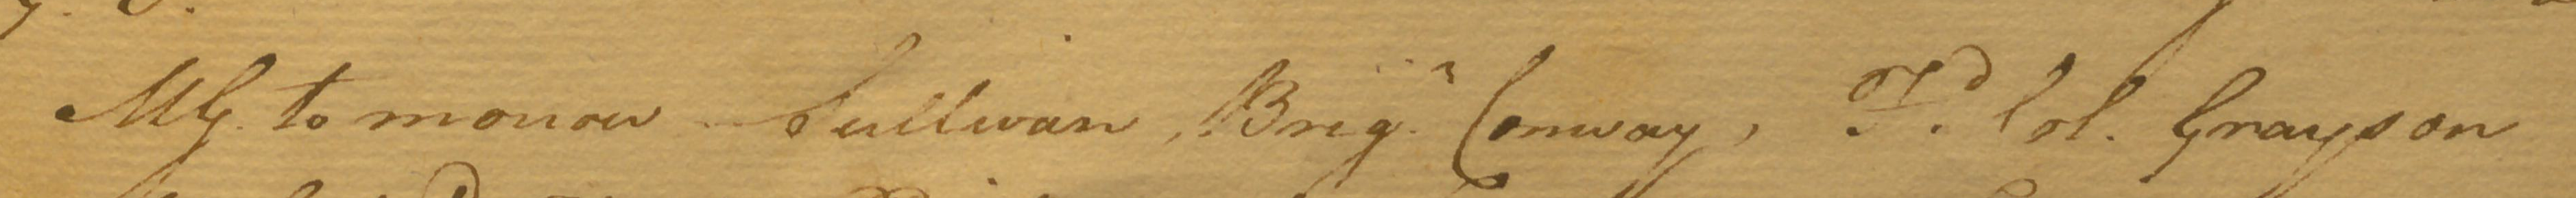MG to morrow Sullivan Brig^r. Conway, F^d. Col. Grayson
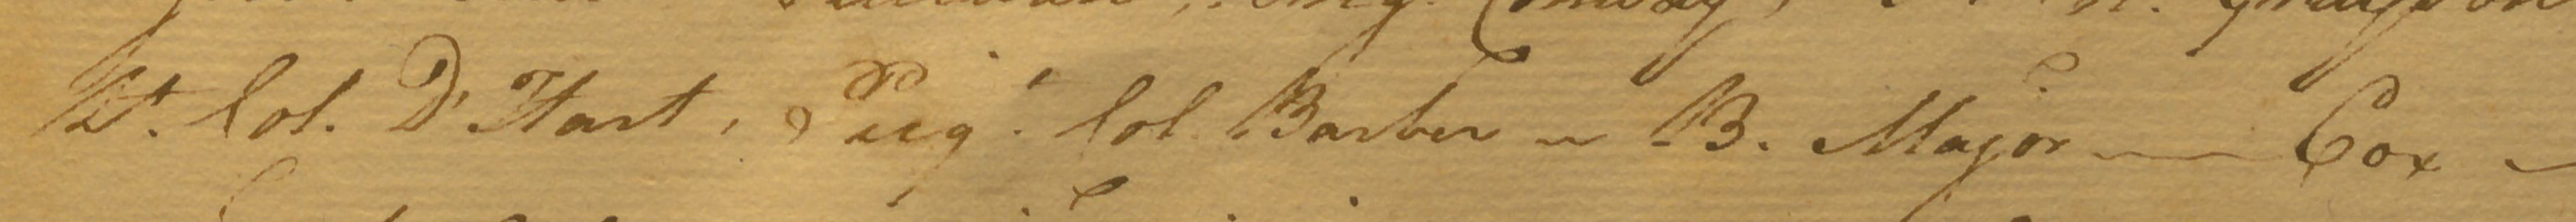L^t. Col. D Hart. Picq^t. Col Barber- B. Major- Cox-
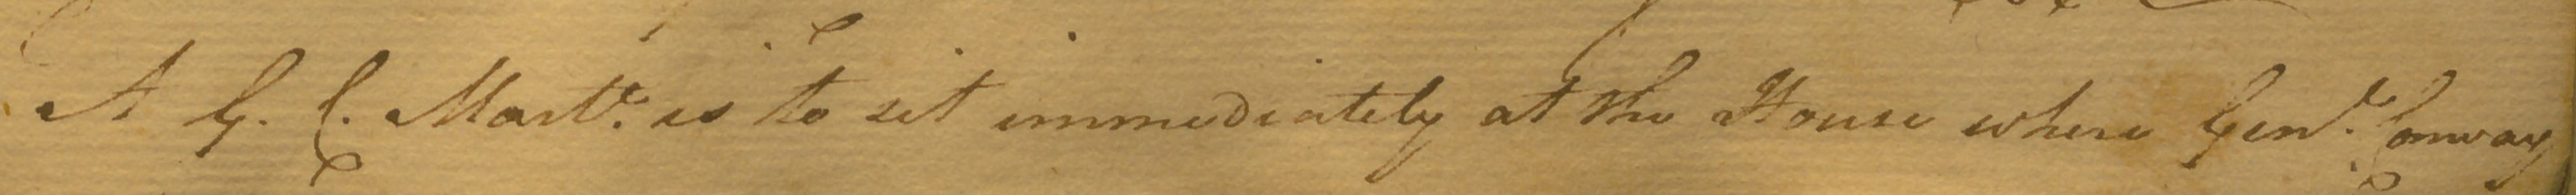AG.C. Mart^l. is to sit immediately at the House where Gen^l. Conway
